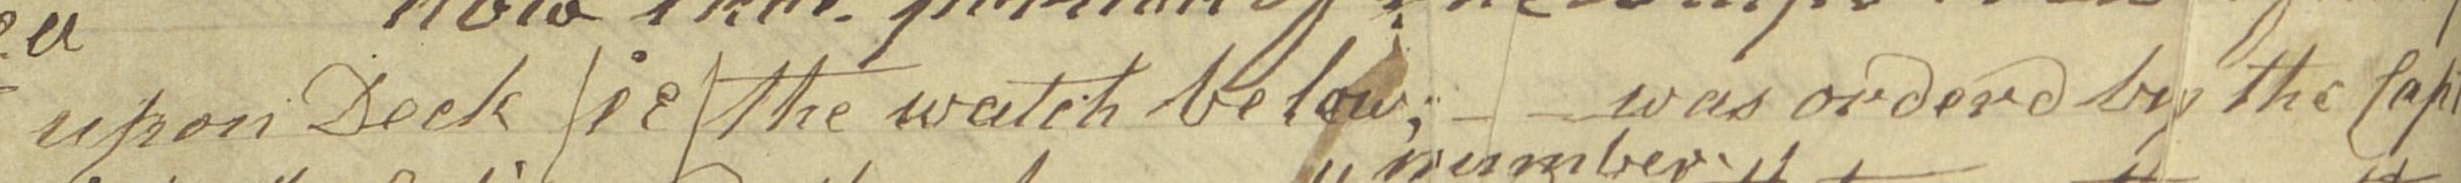upon Deck (ie) the watch below; was ordered by the Capt
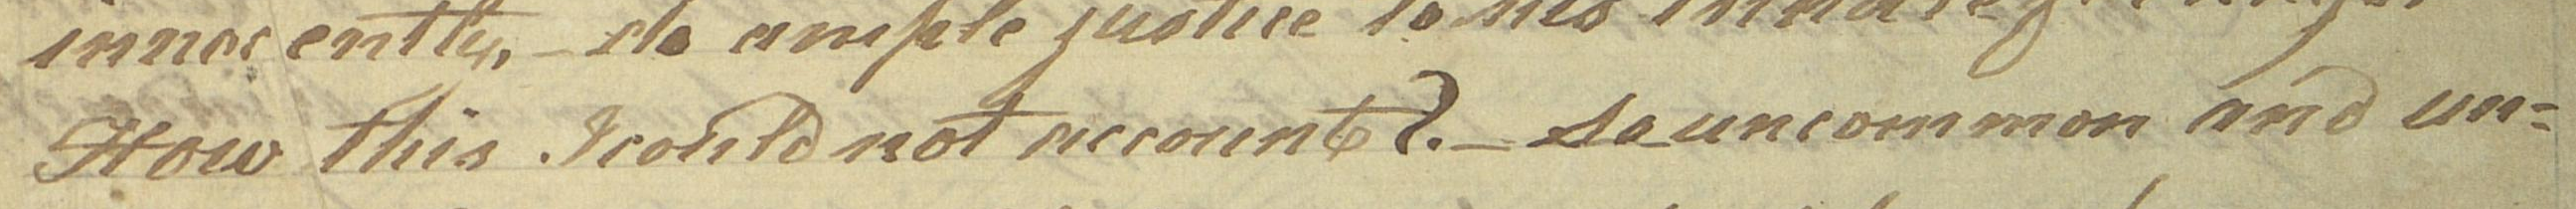How this I could not recount? So uncommon and un-
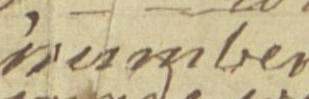number
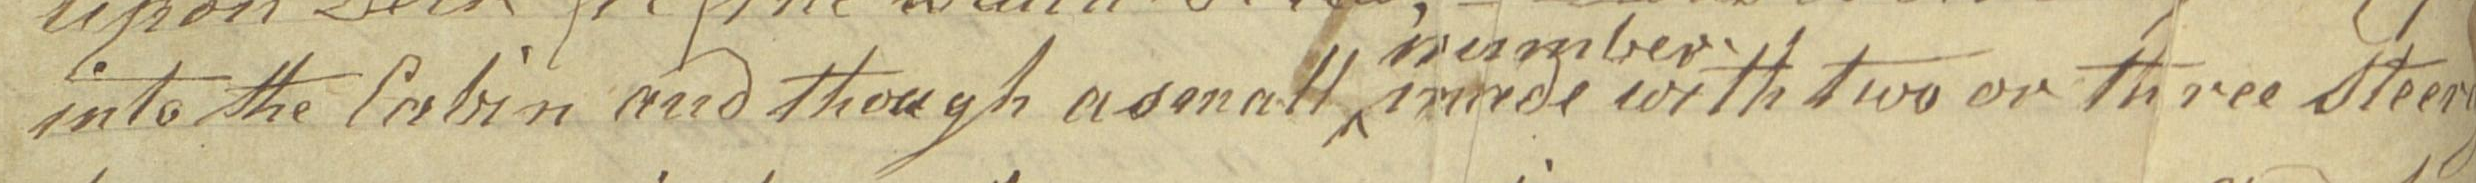into the Cabin and though a small ^ made with two or three steer
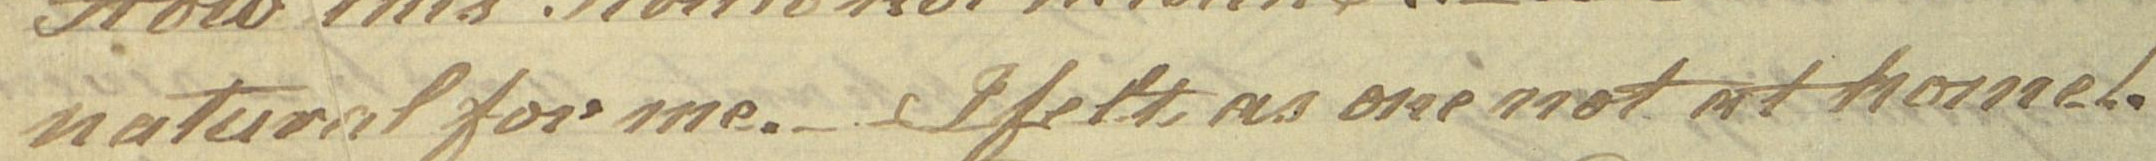natural for me. I felt as one not at Home.
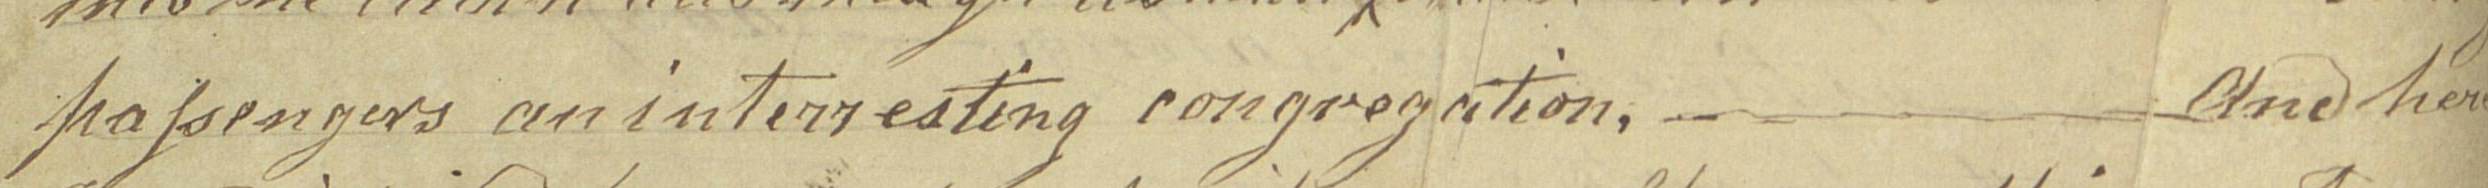passengers an interresting congregation. And her
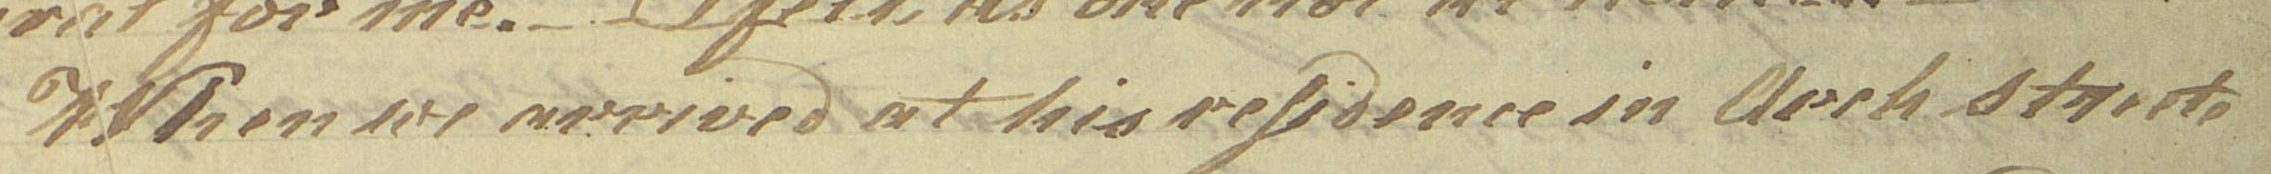When we arrived at his residence in Arch street
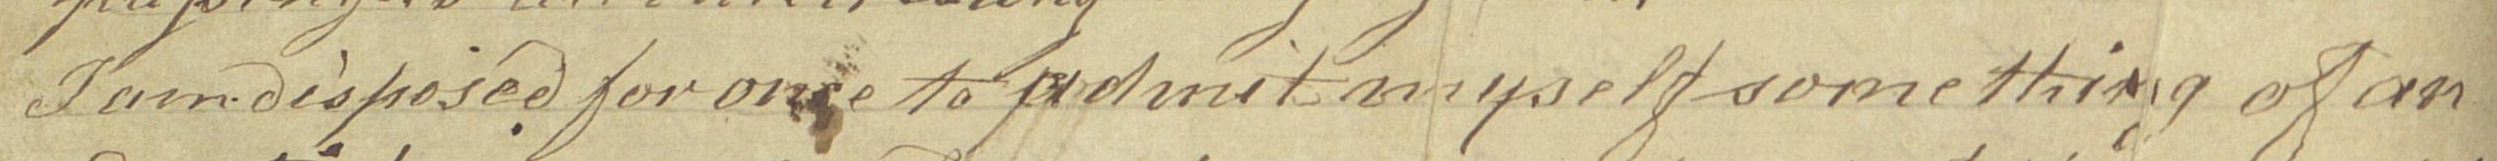I am disposed for once to admit myself something of an
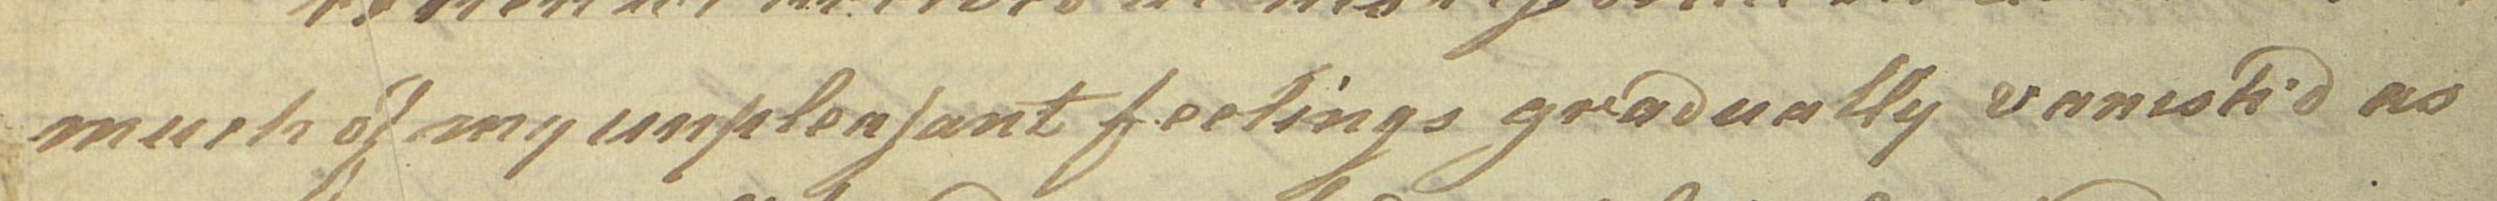much of my unpleasant feelings gradually vanish'd as
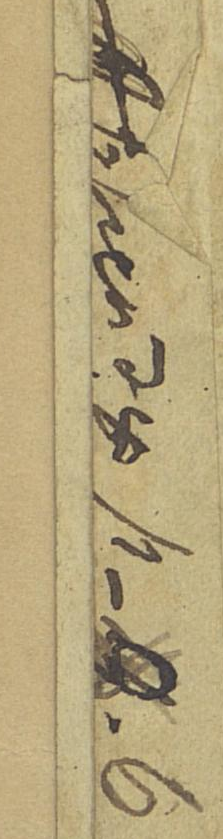Abner 24 p. 8.6
